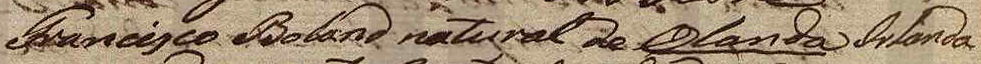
Francisco Boland natural de Olanda Irlanda
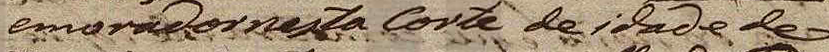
e morador nesta corte de idade de
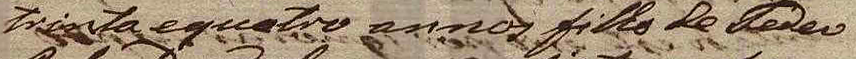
trinta e quatro annos filho de Tedeo
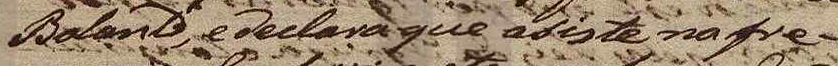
Boland, e declara que asiste na fre
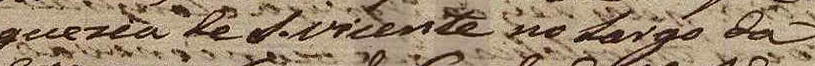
guezia de S. Vicente no Largo da
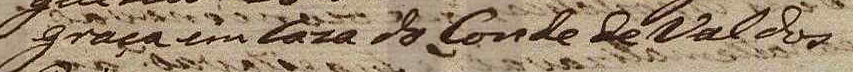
Graça em caza do Conde de Val dos
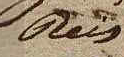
Reis
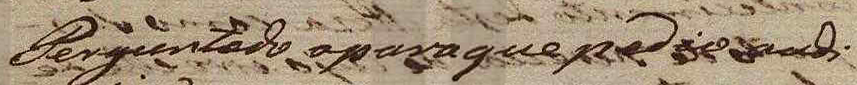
Perguntado o para que pedio audi
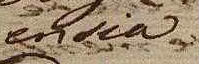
ensia
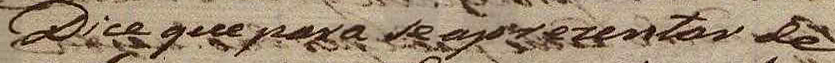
Dice que para se aprezentar de
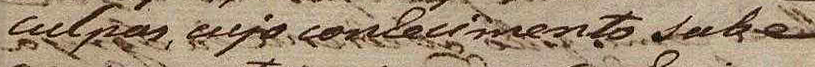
culpas, cujo conhecimento sabe
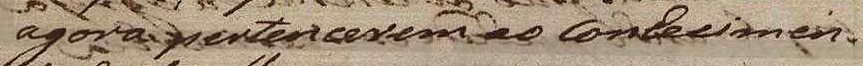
agora pertencerem ao conhecimen
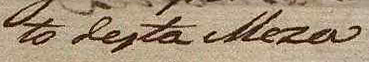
to desta Meza
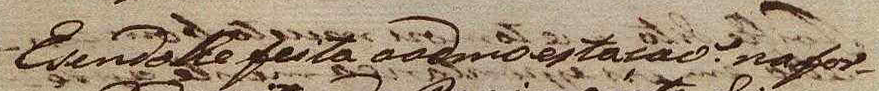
E sendolhe feita a admoestaçaõ na for
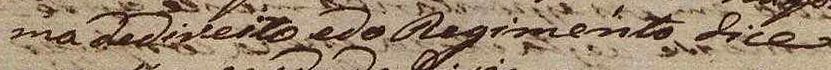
ma de direito, e do Regimento dice
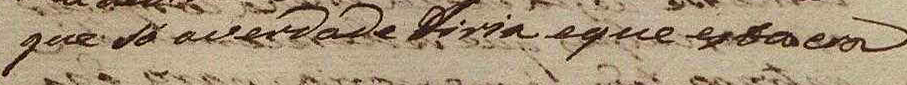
que só a verdade diria e que esta era
